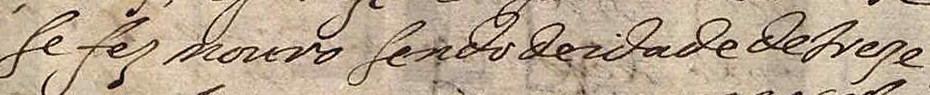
se fez mouro sendo de idade de treze
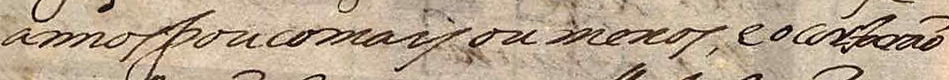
annos pouco mais ou menos, e o cortaraõ
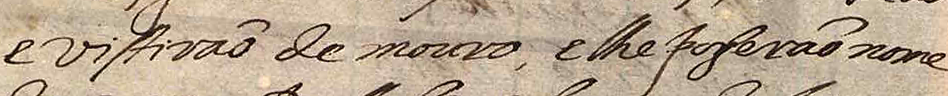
e vistiraõ de mouro e lhe poseraõ nome
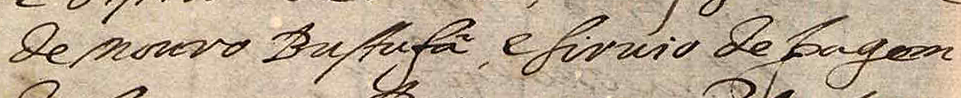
de mouro Bustufâ, e siruio de pagem
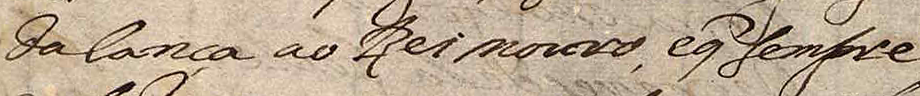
da lança ao Rei mouro, e q̄ sempre
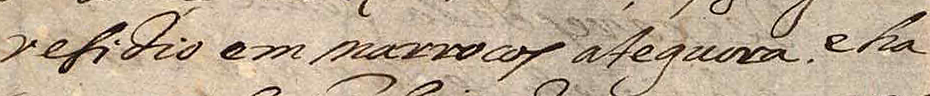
residio em marrocos ate guora, e ha
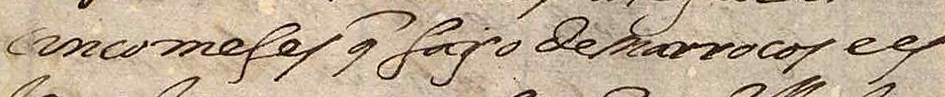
cinco meses q̄ sayo de marrocos e es
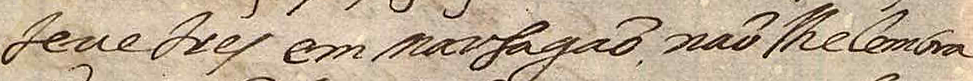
teue tres em marsagaõ, naõ lhe lembra
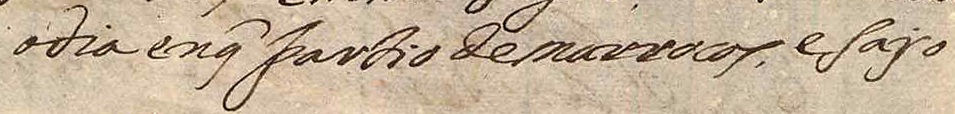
o dia en q̄ partio de marrocos, e sayo
